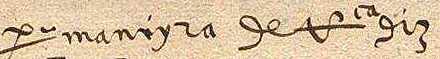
ꝑe maneyra de Rca diz
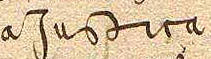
a Justiça
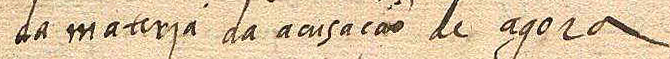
da materja da acusaçaõ de agora
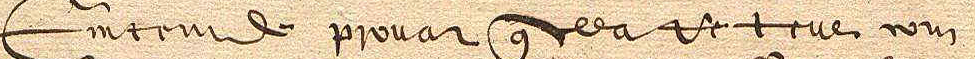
Emtemde prouar q̄ ella Re teue com
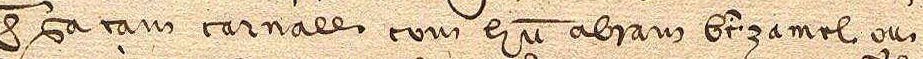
ꝟsaçam carnall com hū abram bēzamel ou
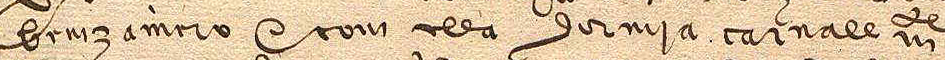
bemzamero e com ella dormja carnallmte
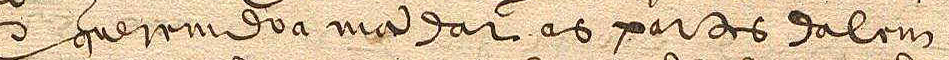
e queremdoa mādar as partes dalem
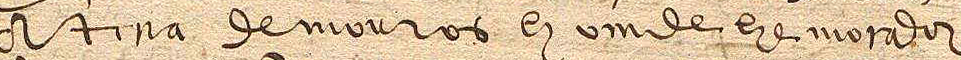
A terra de mouros homde he morador
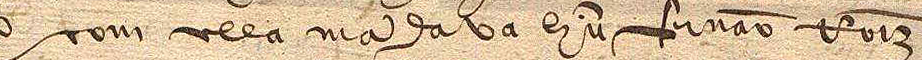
e com ella mādava hū fernão Rōiz
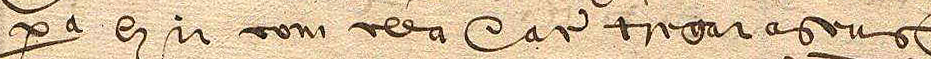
ꝑa hir com ella e a ētregar a seus
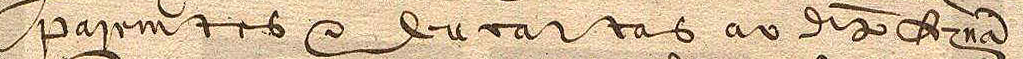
paremtes e deu cartas ao dito fernā
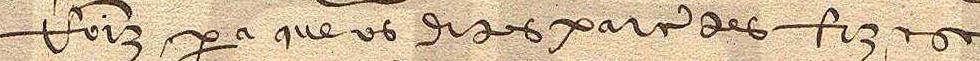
Roīz ꝑa que os dito parētes fizesē
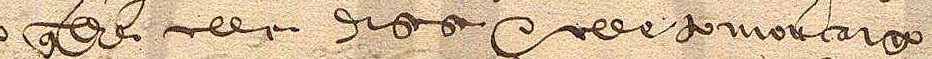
o q̄ lhe elle disese e elle tomou cargo
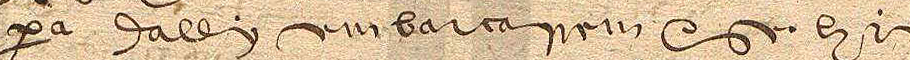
ꝑa dally embarcarrem e se hir
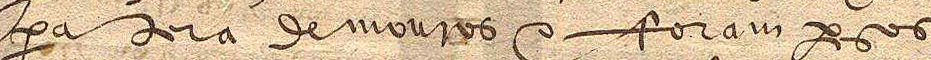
ꝑa tera de mouros e foram ꝑesos
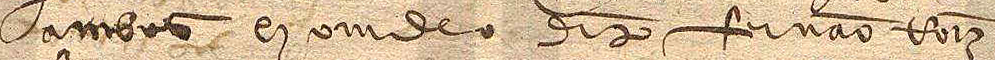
ambos homde o dito fernão Roīz
